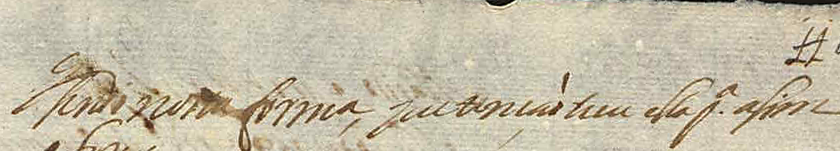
E sendo nesta forma, que tençaõ teue ela p.a asim
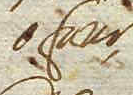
o fazer,
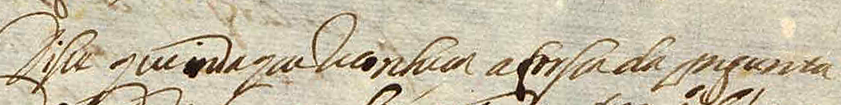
Disse que inda que Reconheça a forssa da pregunta
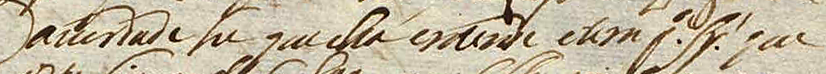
a uerdade he que ella entende e tem p.a sy. que
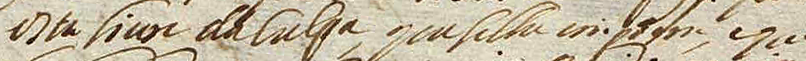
esta liure da culpa, que se lhe impom, e que
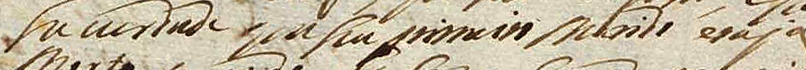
he uerdade que seu primeiro marido era ja
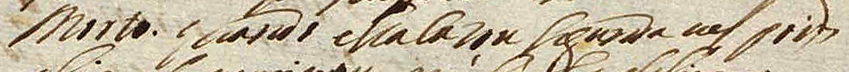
morto. quando ella cazou segunda ues pois
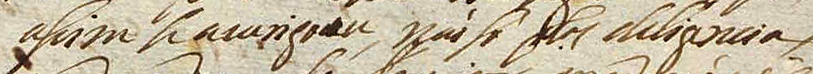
assim se auerigoou, naõ só p.las deligencias
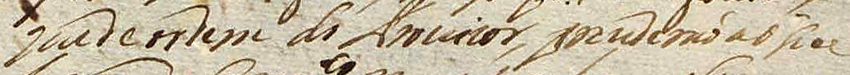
que de ordem do Prouizor, prenderaõ ao seu
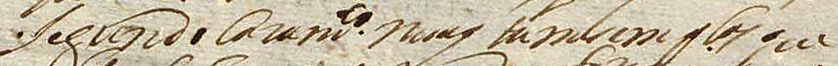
segundo Cazam.to mas tambem p.las que
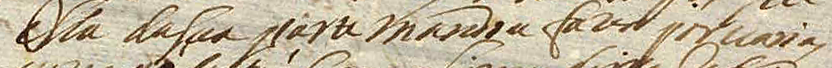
ella da sua parte mandou fazer por uarias
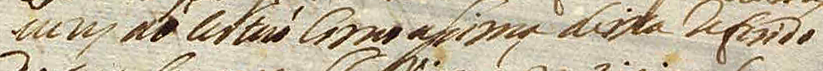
uezes ao certaõ como assima deixa Referido
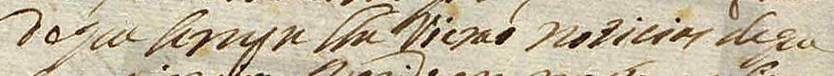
de que sempre lhe vieraõ noticias de que
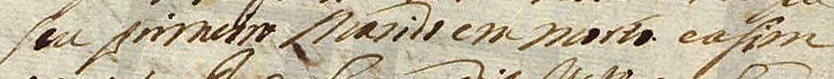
seu primeiro marido era morto. e asim
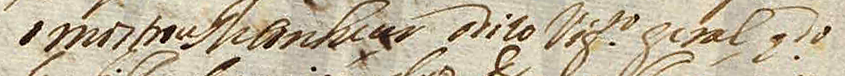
o mostrou Reconhecer o dito Vig.ro geral, q.do
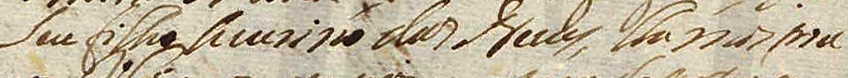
seu filho seuerino das Neues, lha mostrou
